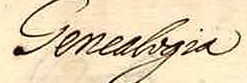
Genealogia
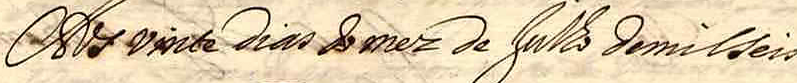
Aos vinte dias do mez de Julho de mil seis
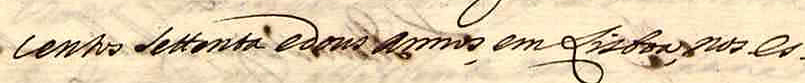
centos settenta e dous annos, em Lisboa, nos es
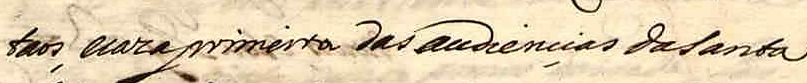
taos, e caza primeira das audiencias da Santa
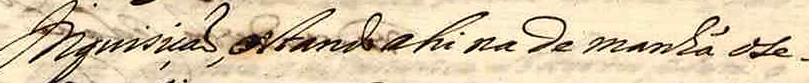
Jnquisiçaõ, estando ahi na de manhã o se
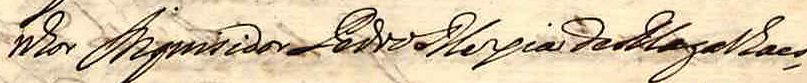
nhor Jnquisidor Pedro Mexia de Magalhaes,
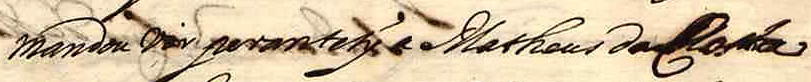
mandou vir perante sy a Matheus da Costa
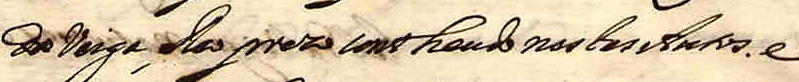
do Veiga, Reo prezo contheudo nestes Autos. E
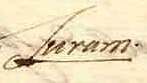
Juram.
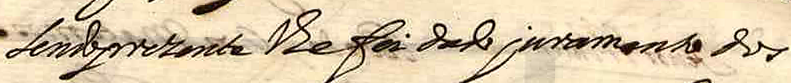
Sendo prezente lhe foi dado juramento dos
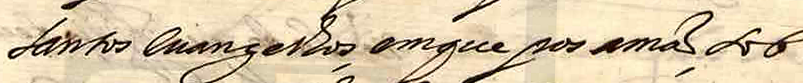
Santos Euangelhos, em que pos a maõ, sob
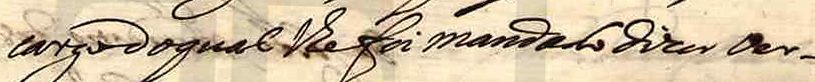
cargo do qual lhe foi mandado dizer ver
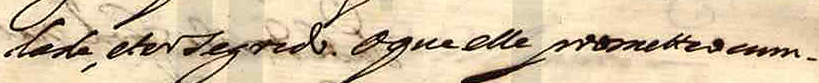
dade, e ter segredo. O que elle prometteo cum
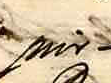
prir.
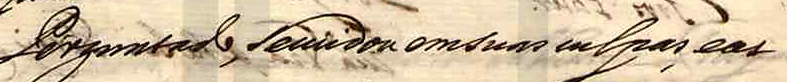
Perguntado, Se cuidou em suas culpas, e as
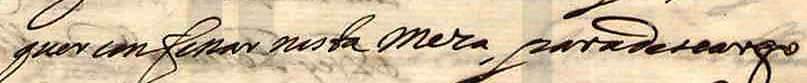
quer confessar nesta Meza, para descargo
